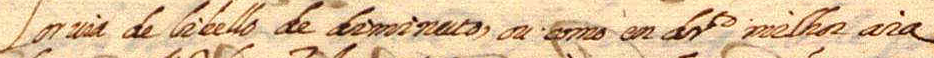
Por uia de libello de diminuto, ou como en drto milhor aia
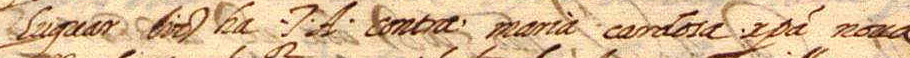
luguar diz a .J. A. contra. maria cardosa. xpā noua
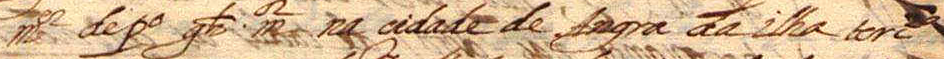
mer de po gl̄z. mor na cidade de Angra da ilha tercra
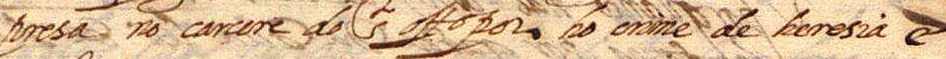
presa no carcere do sto offo por ho crime de heresia e
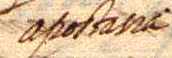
apostasia
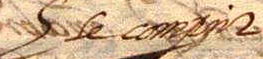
E se comprir
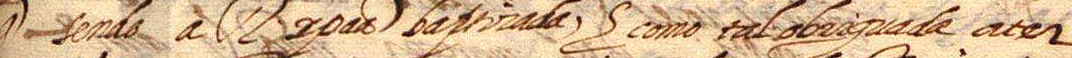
q̄ sendo a R. xpaā baptizada, E como tal obriguada a ter
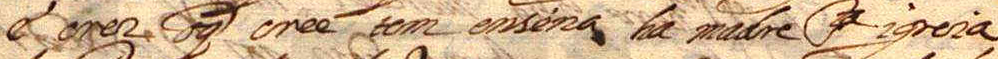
e crer o q̄ cree tem ensina ha madre sta igreia
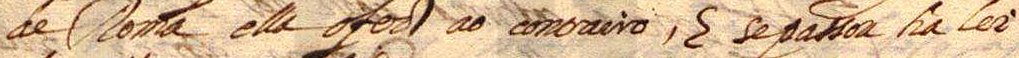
de Roma ella o fez ao contrairo, E se passou ha lei
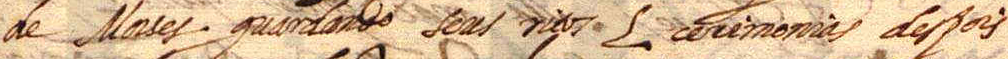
de Moises. guardando seus ritos E cerimonias despois
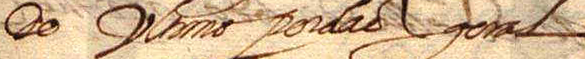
do Vltimo perdaõ geraL
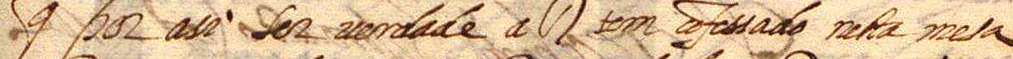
q̄ por asi ser uerdade a R tem cōfessado nesta mesa
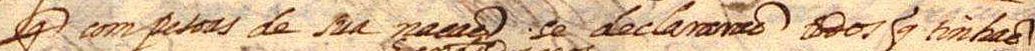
q̄ com pesoas de sua nacaõ se declararaõ todos q̄ tinhaõ
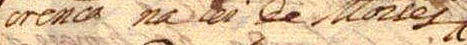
crenca na lei de Moises
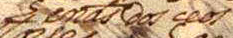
E en d̄s dos ceos
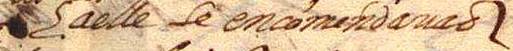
E a elle se encōmendauaõ
